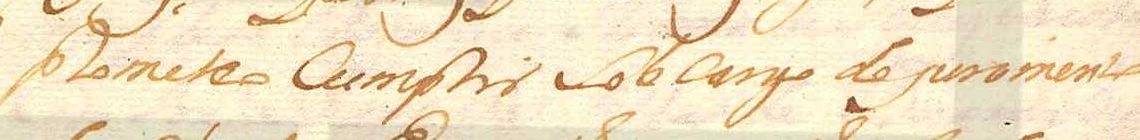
pRometeo CumpRir sob cargo de juramento
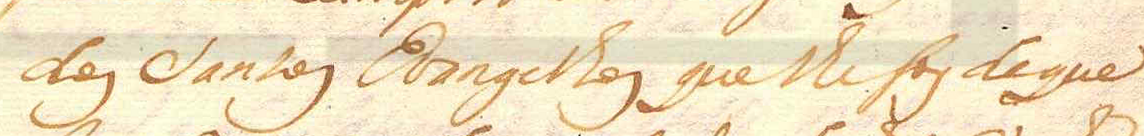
dos Santos Evangelhos que lhe foy de que
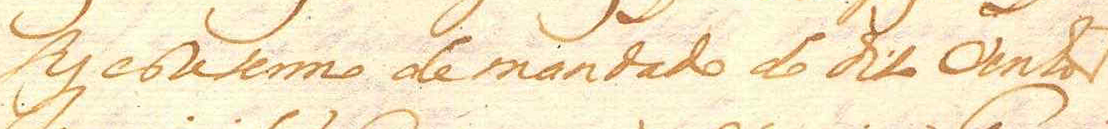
fis este termo de mandado do dito Senhor
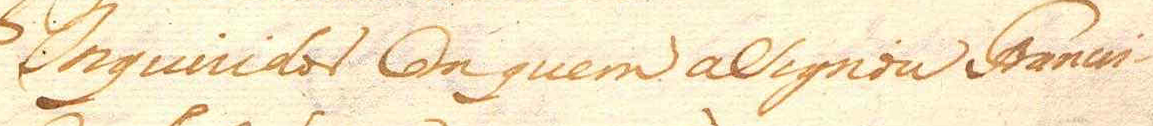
Inquizidor Com quem asignou Francis
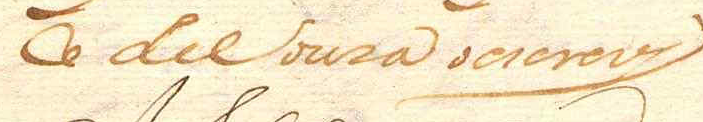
co de Souza o escrevj
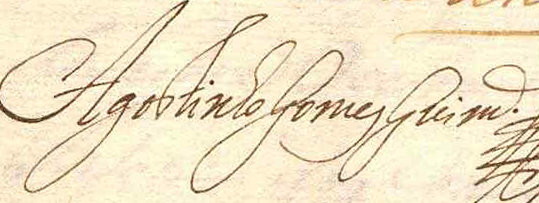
Agostinho Gomes Guim.es
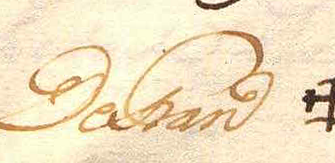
De Fran.co
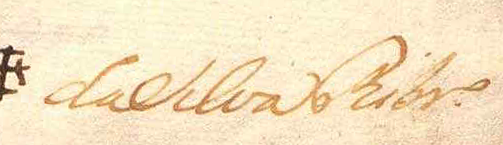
da Silva Ribr.o
